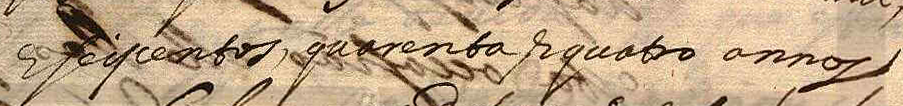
E seiscentos, quarenta, E quatro annos
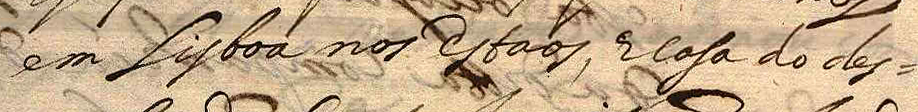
em Lisboa nos Estaos, E casa do des
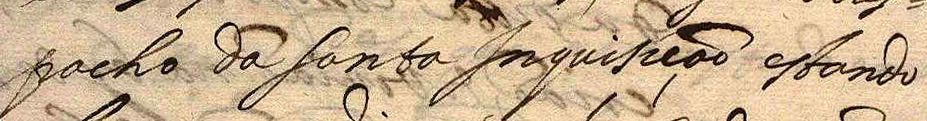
pacho da santa Jnquisição estando
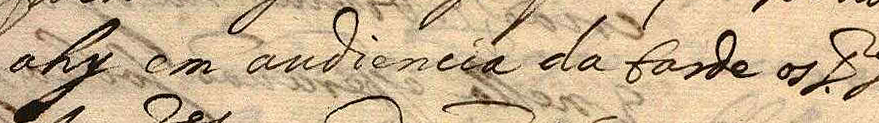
ahy em audiencia da tarde os s.res
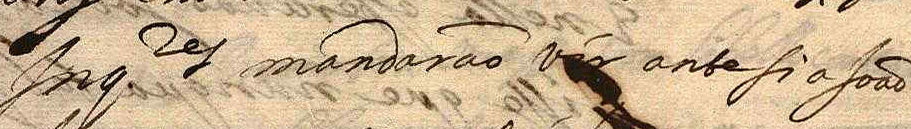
Jnq.res mandarão vir ante si a João
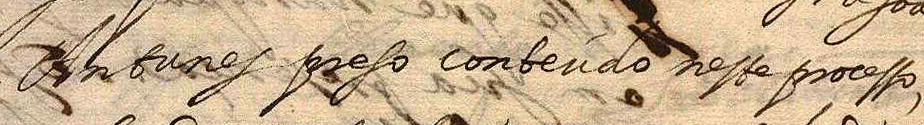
Antunes preso conteudo neste processo,
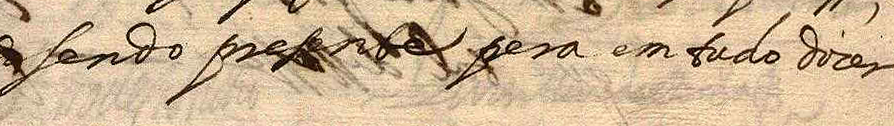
e sendo presente pera em tudo dizer
